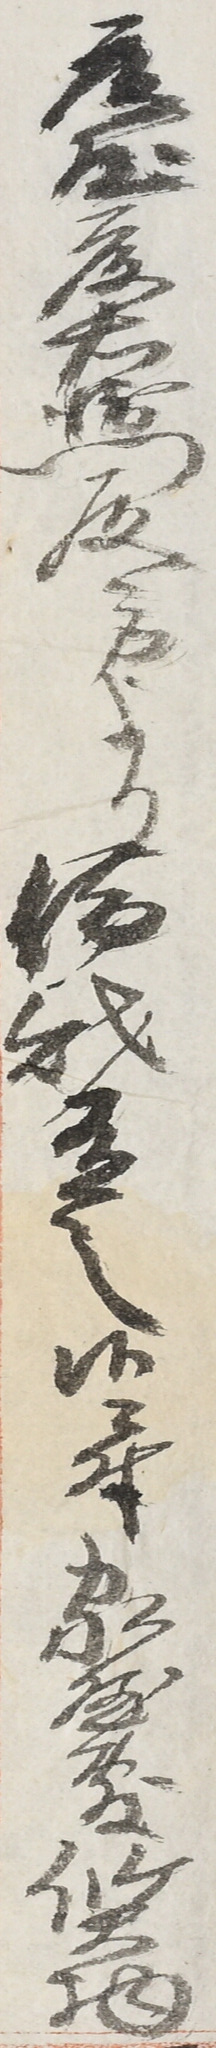藤屋藤右衛門殿方より借財有之候ニ付家屋敷質物ニ
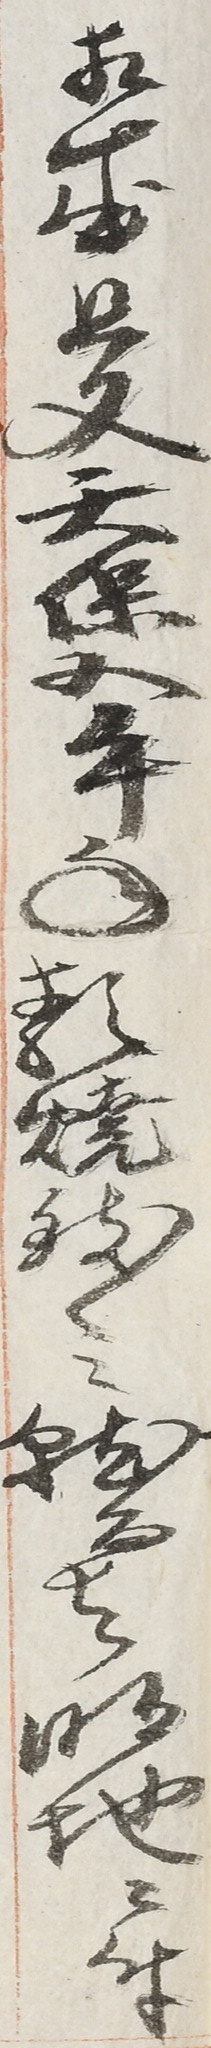相成且又天保五午年類焼致候ニ就而者明地ニ付
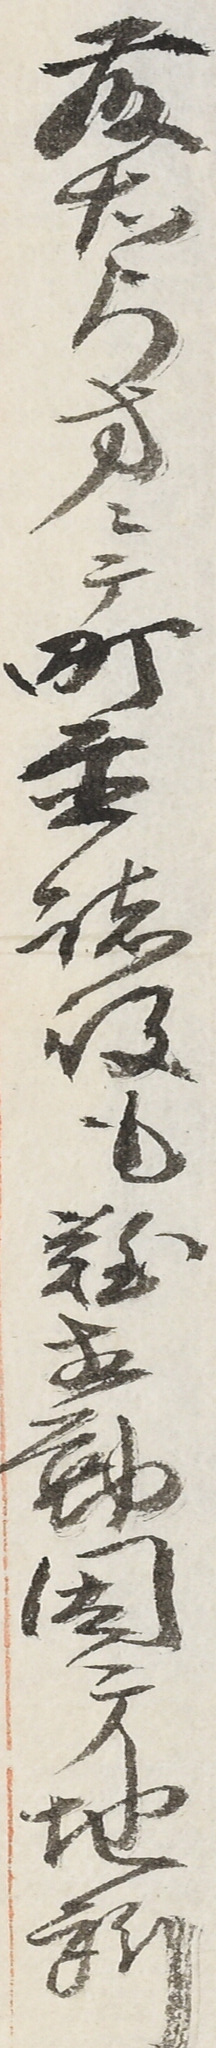藤右衛門方ニテ町並諸役も難相勤因テ地所
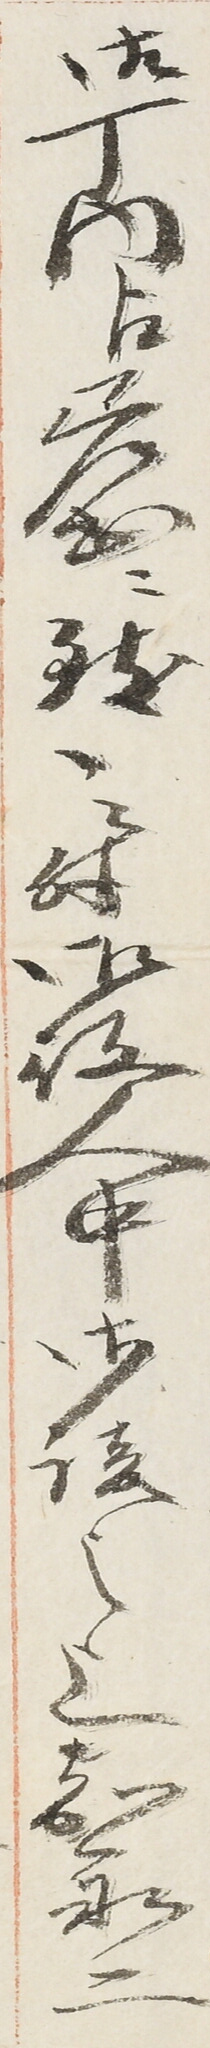御丁内江差出ニ致候ニ付御役人中御談之上嘉永二
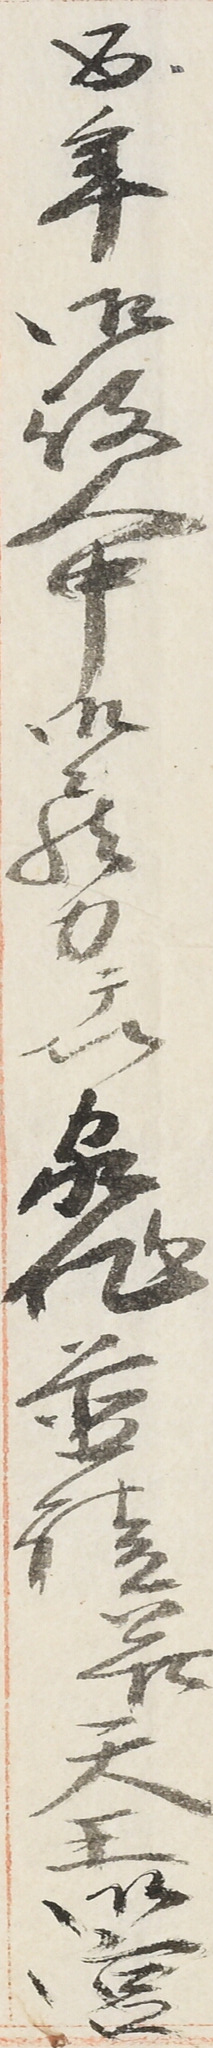酉年御役人中御尽力ヲ以家作普請幷天王御宮
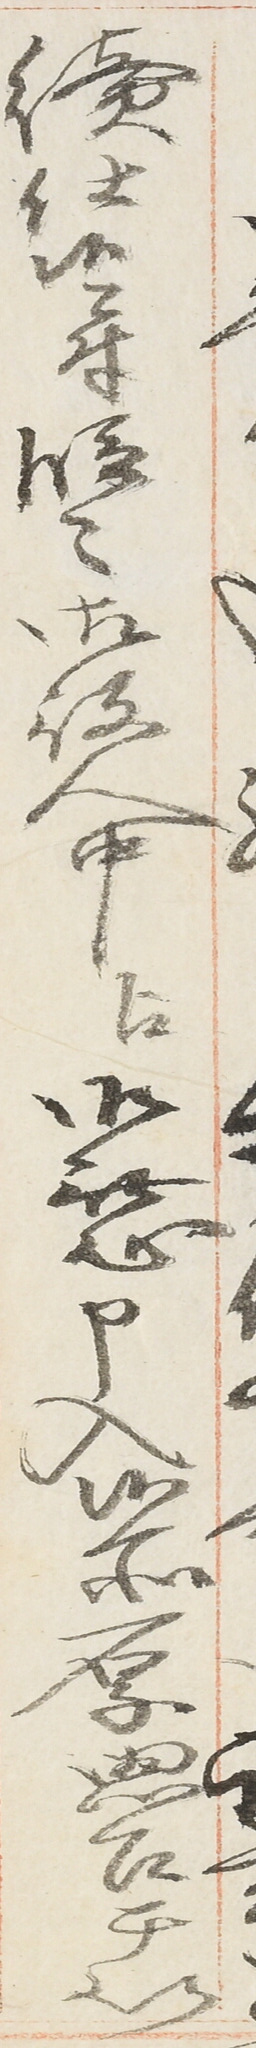続仕候ニ付段々御役人中江御無心申入候所厚思召ヲ以
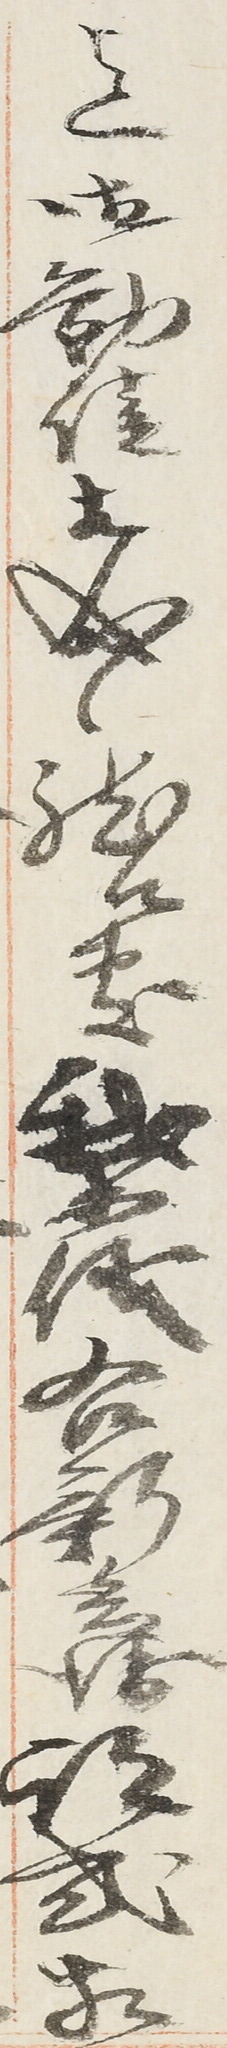迄御勧請相成候然ル処我等儀右新兵衛跡式相
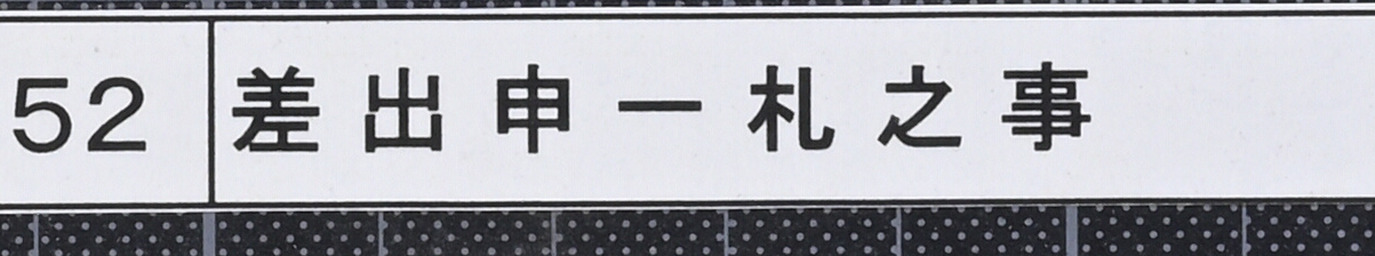差出申証書之事
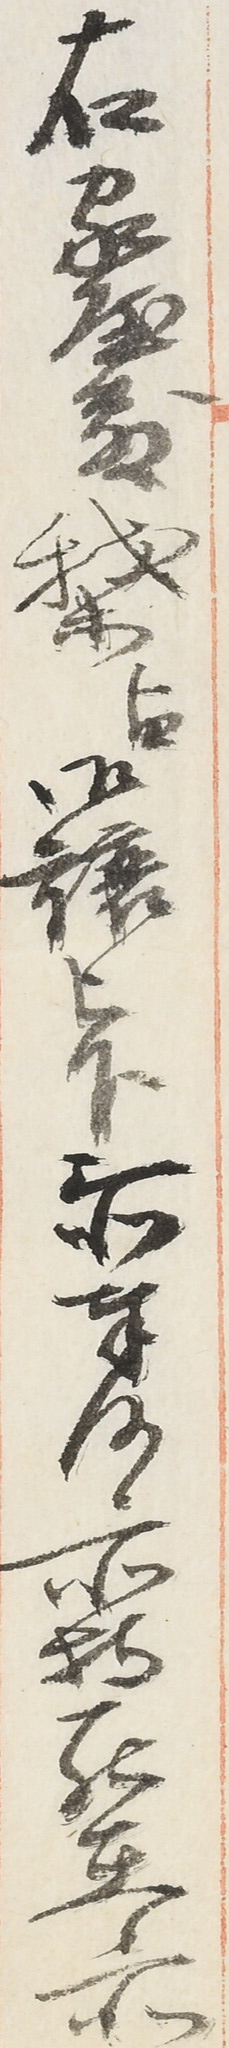右家屋敷我等江御譲被下忝奉存候所所持罷在候所
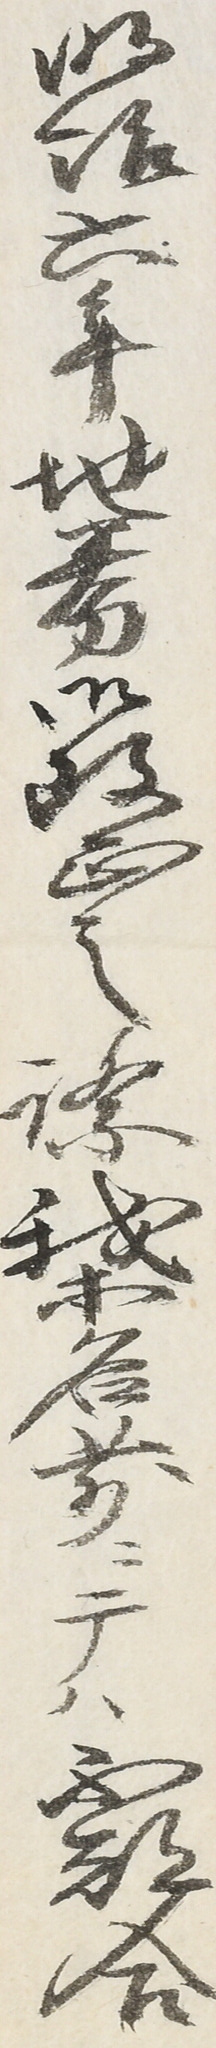明治六年地券御改正之際我等名前ニテハ不都合
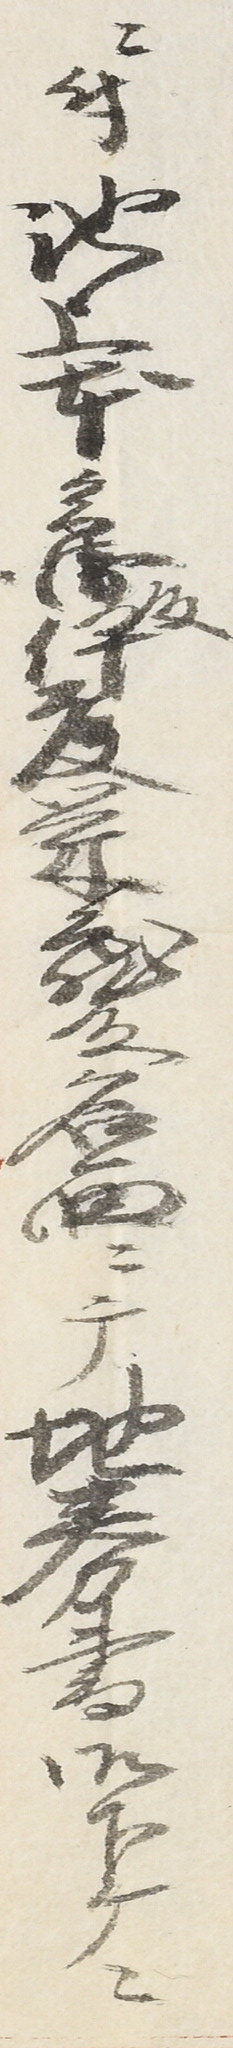ニ付池上本衛殿伊藤栄蔵殿名面ニテ地券書御下ケニ
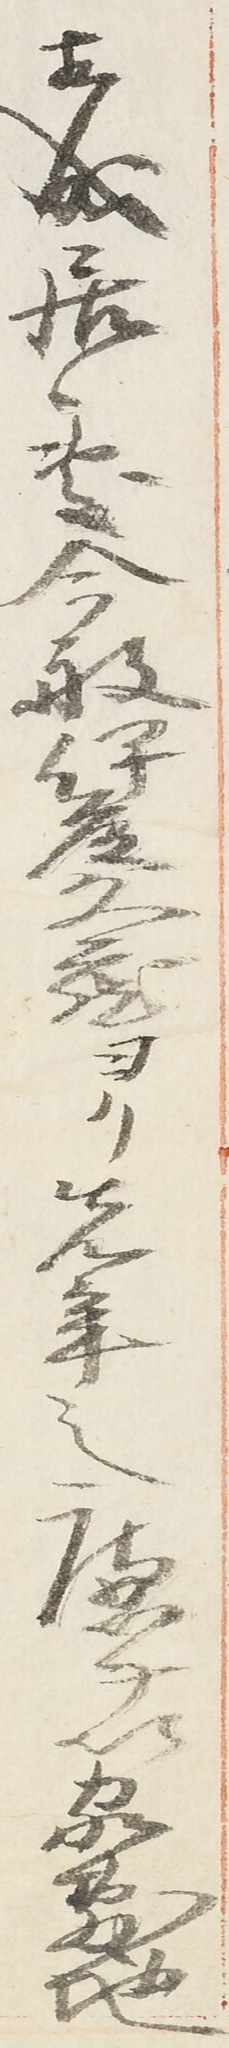相成居候処今般伊藤久蔵ヨリ先年之廉ヲ以家敷地
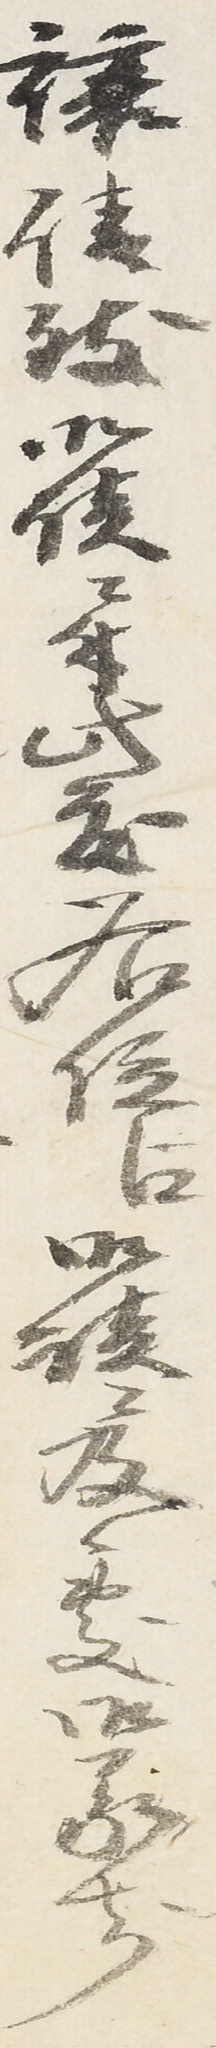譲請致御談ニ付此度各位江御談ニ及候処御承知
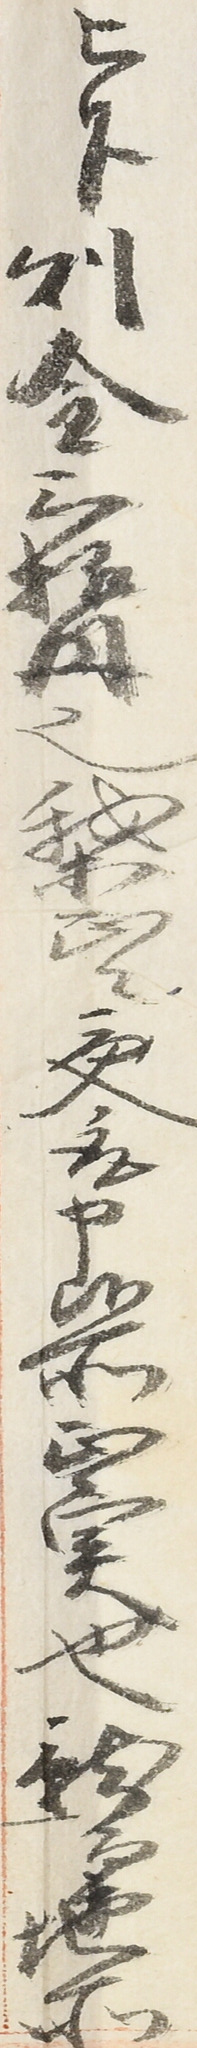被下則金三拾円也我等正ニ受取申候所正実也就而地所
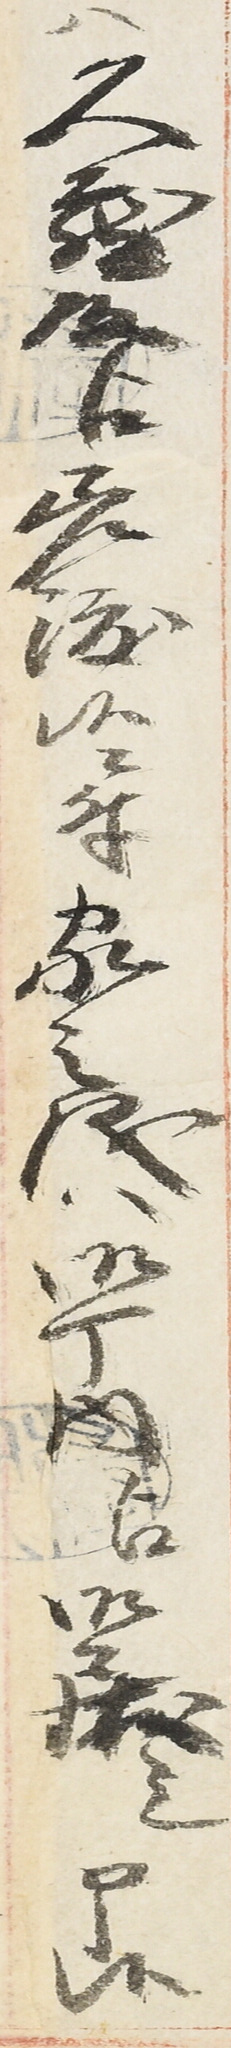ハ久蔵殿江差渡候ニ付家之儀ハ御丁内江御戻シ申候
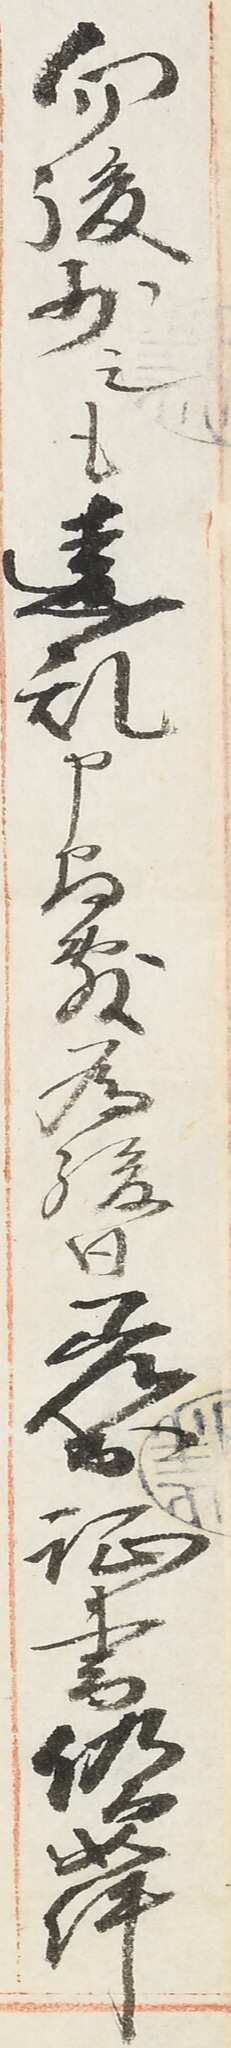向後少シも違乱申間敷為後日差出証書仍而如件
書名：差出申一札之事
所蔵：伊那市立高遠町図書館・合同会社AMANE
